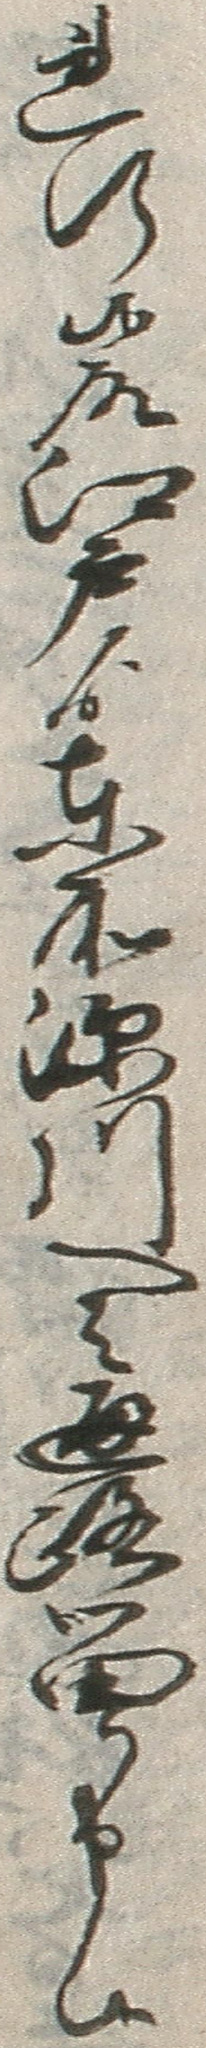れ行候故江戸ゟ本所深川へは通路留り申候
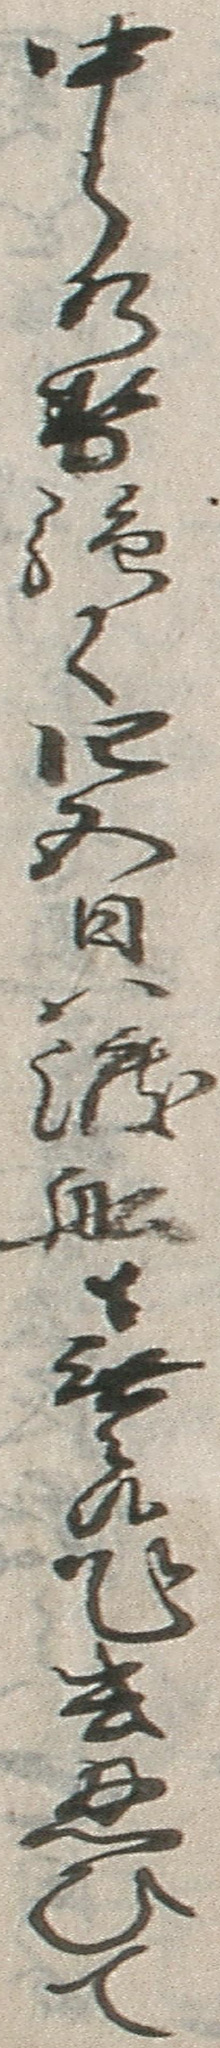中々水勢強く四五日は渡船も無之候乍去忍ひて
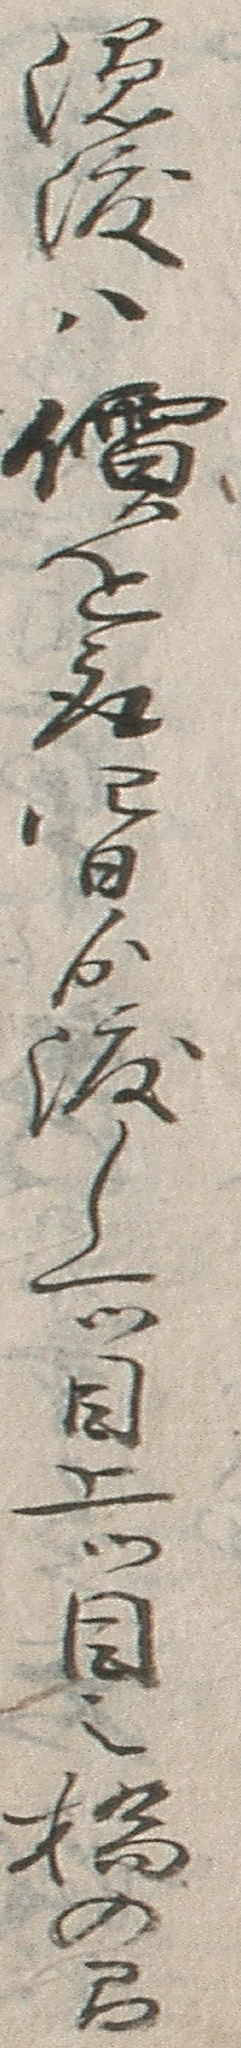隠渡は価を取四日ゟ渡し一ッ目二ッ目之橋の間

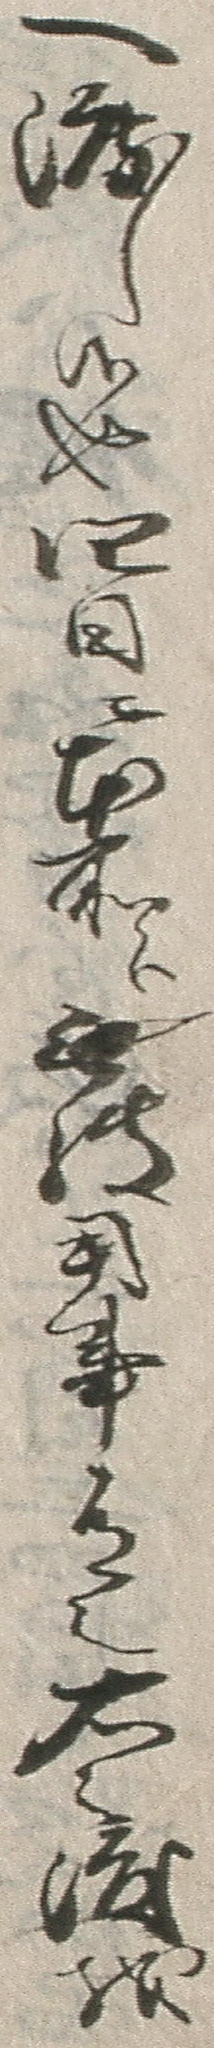へ渡し候也四日に本所え無拠用事有之右之渡を
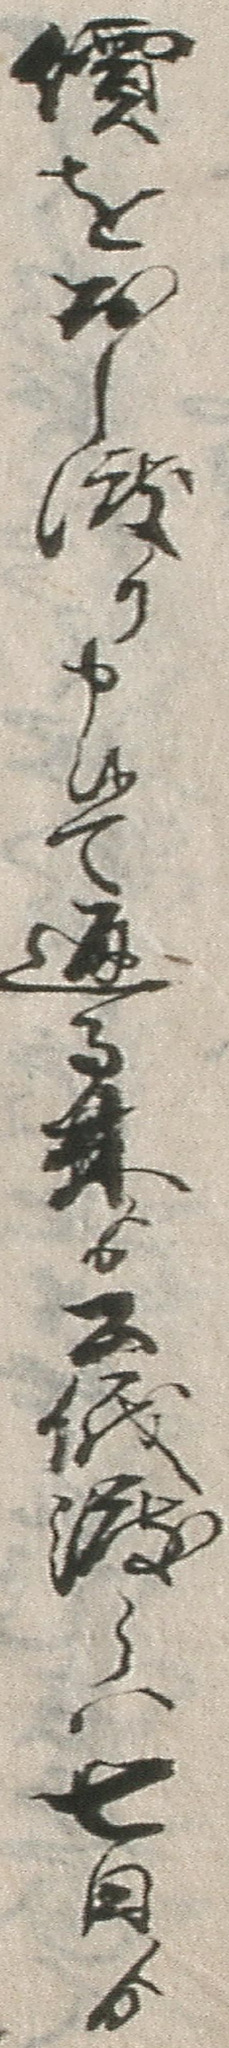価を出し渡リ申候て通る来ゟ公儀渡らは七日ゟ
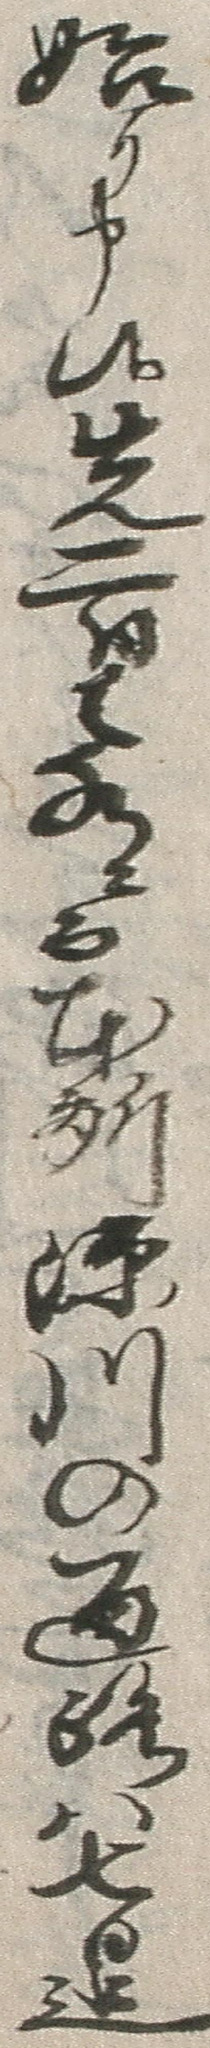始リ申候先二日は水に而本所深川の通路は七日迄
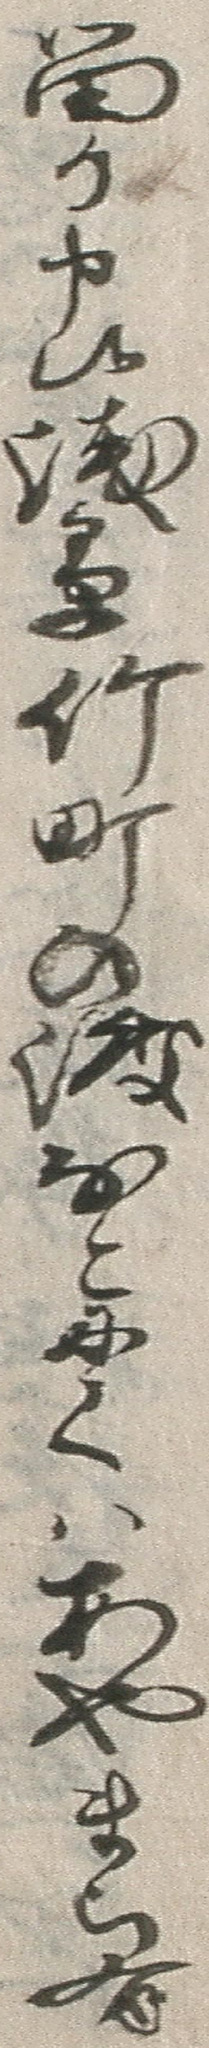留リ申候浅草竹町の渡なとにてはあやまち有
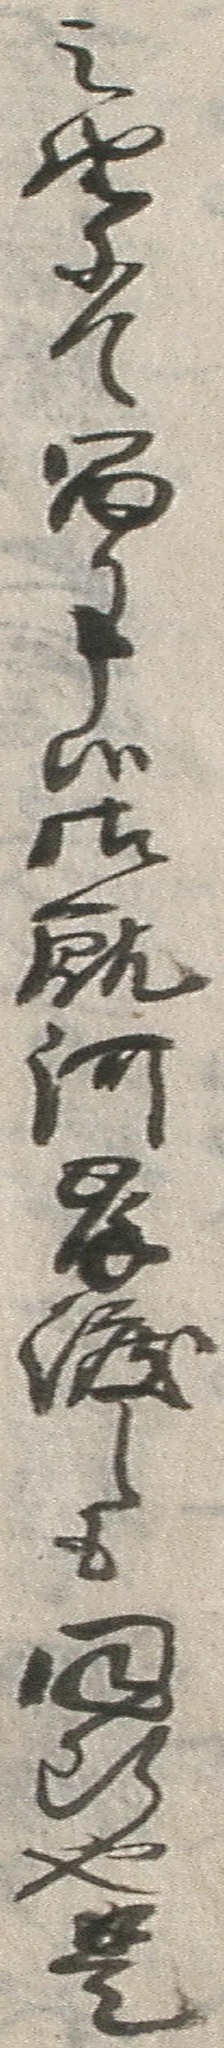之由にて留り申候御厩河岸渡しも同断也是
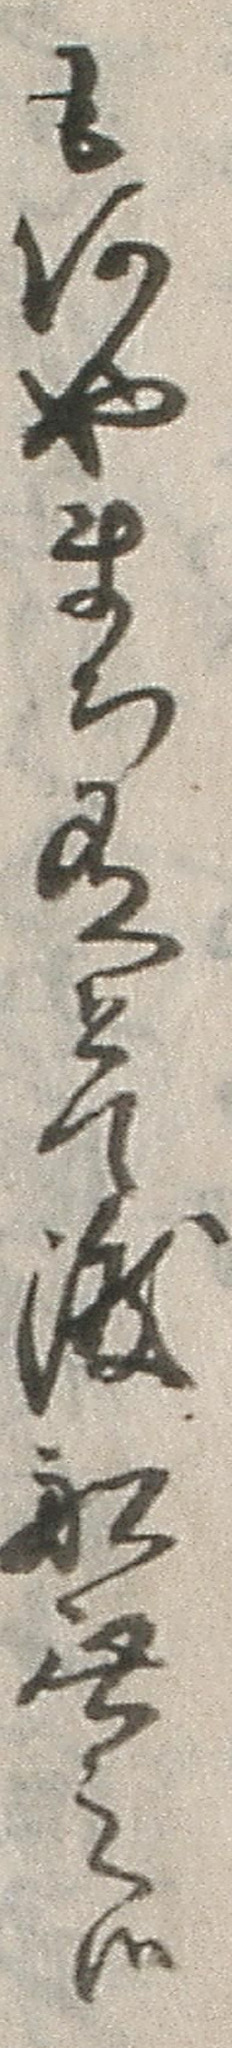もあやまち有とて渡船無之候
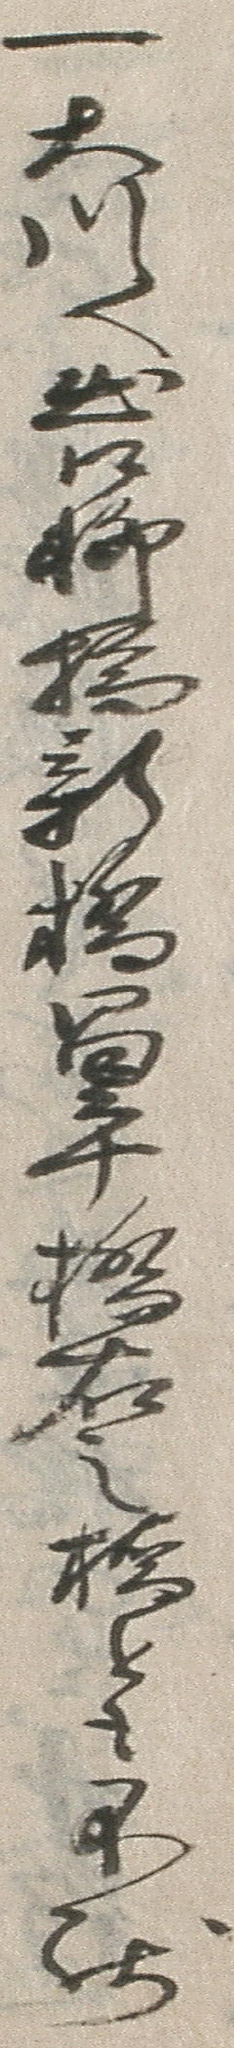一大川へ出口柳橋新橋昌平橋右之橋とも不残
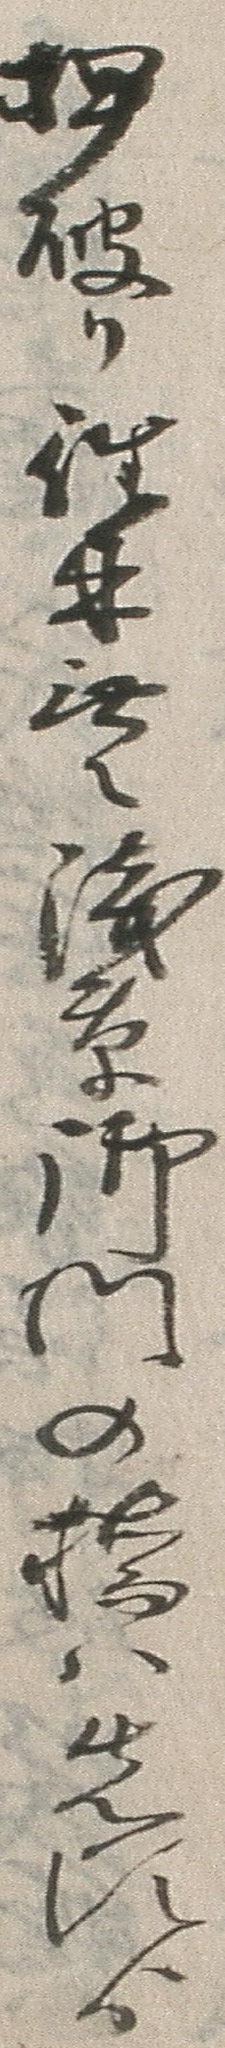押破り往来無之浅草御門の橋は先頃ゟ
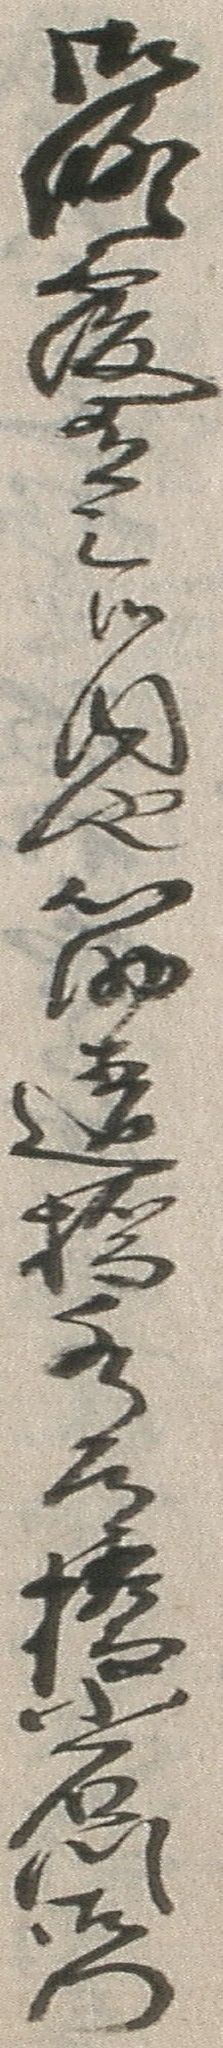御修覆有之候内也筋違橋水道橋小石川御門
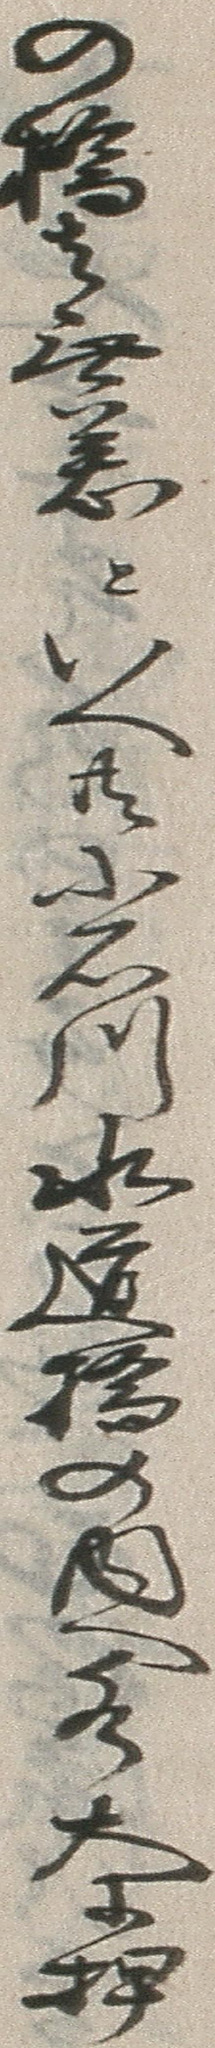の橋は無恙といへ共小石川水道橋の内へ水大に押
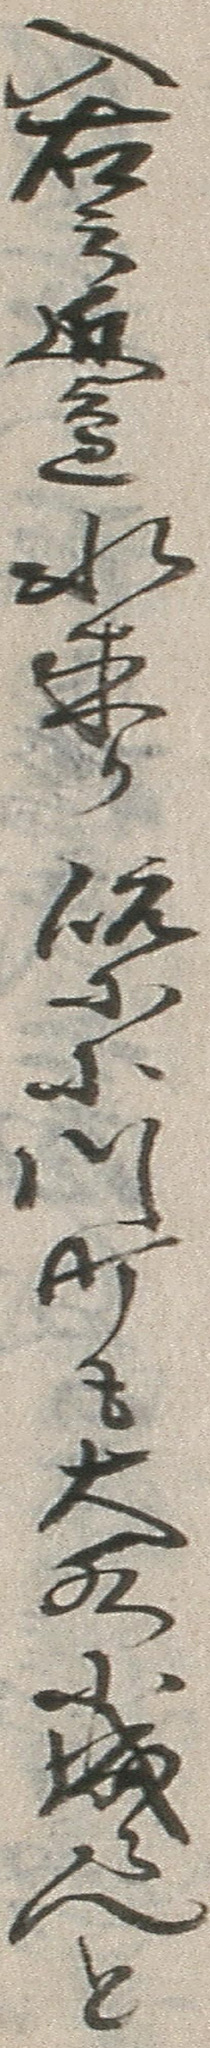入右之近辺水来り既に小川町も大水に成らんと
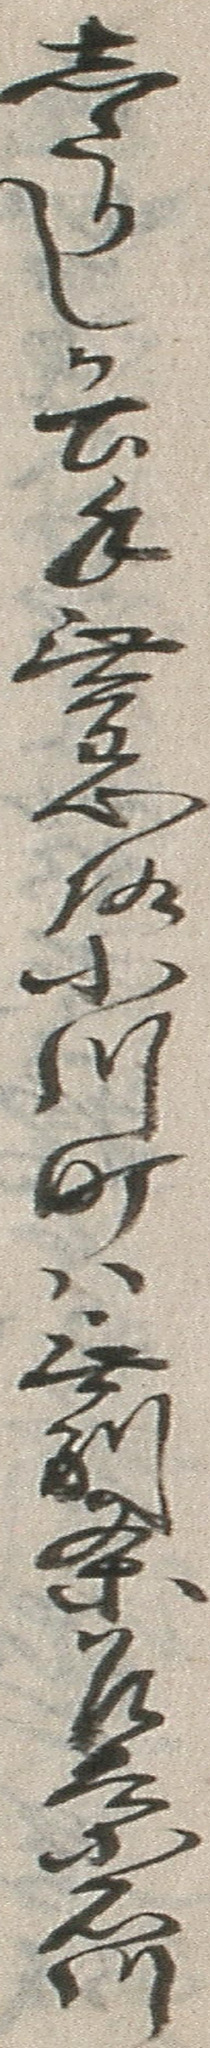したりしか土手無恙故小川町は無別条乍去小石川
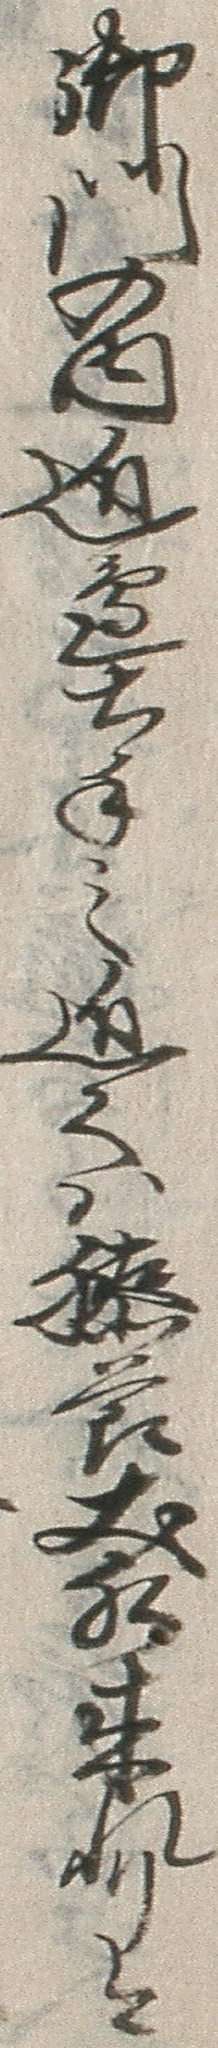御門の内近辺土手之近くは膝節丈水来れりと
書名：享保十三年江戸洪水記
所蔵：東京大学地震研究所図書室 Earthquake Research Institute Library, The University of Tokyo, JAPAN
